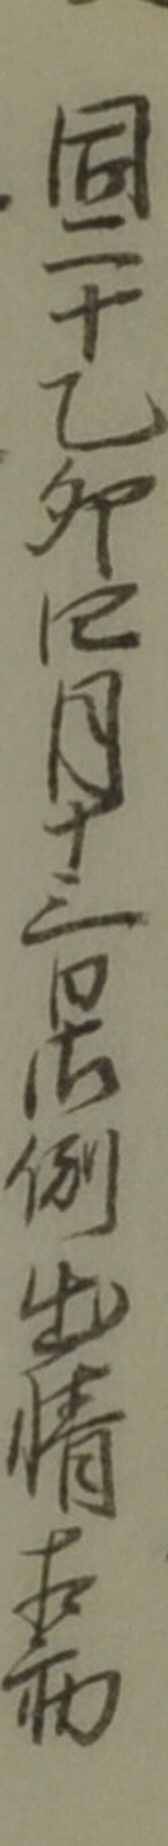一同二十乙卯四月十三日御側出情相勤
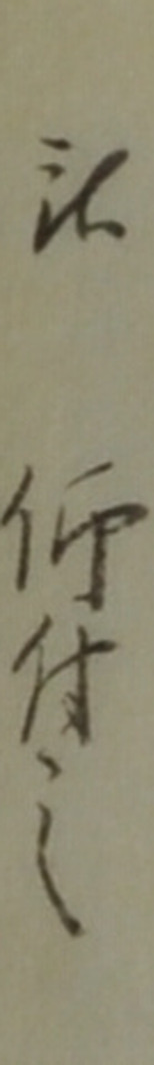被仰付之
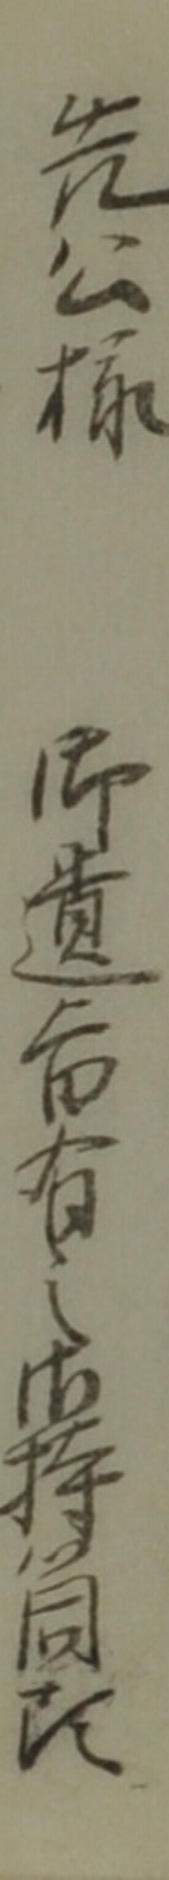先公様御遺旨有之御持筒頭
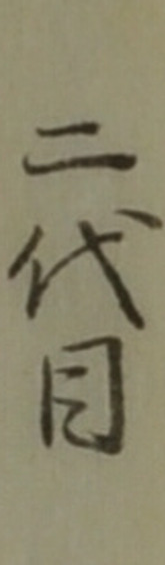二代目
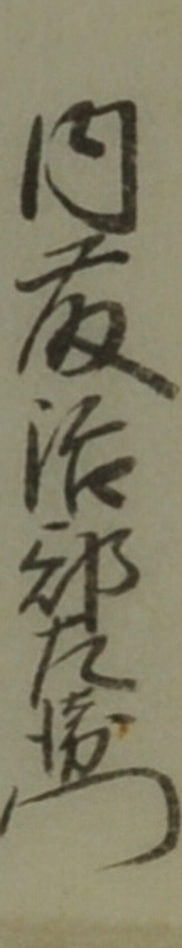内藤治部左衛門
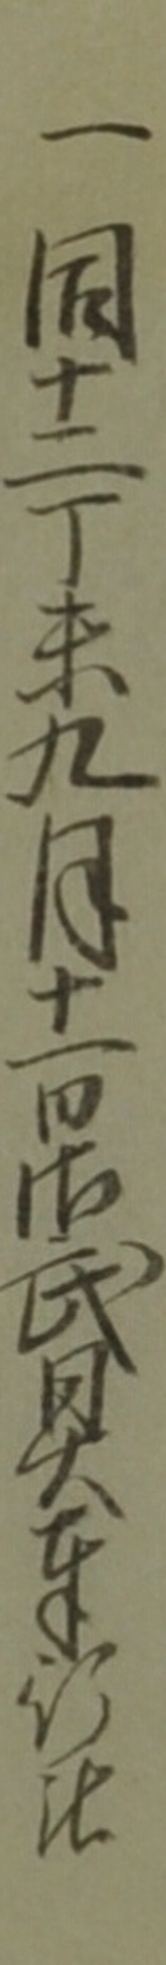一同十二丁未九月十一日御武具奉行被
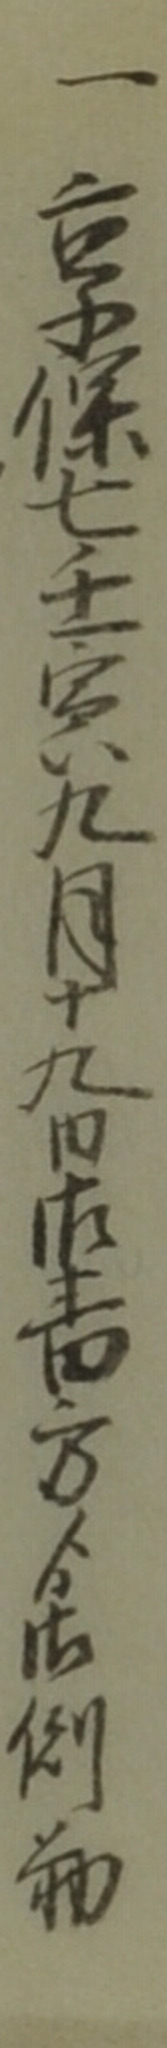一享保七壬寅九月十九日御番方ゟ御側勤
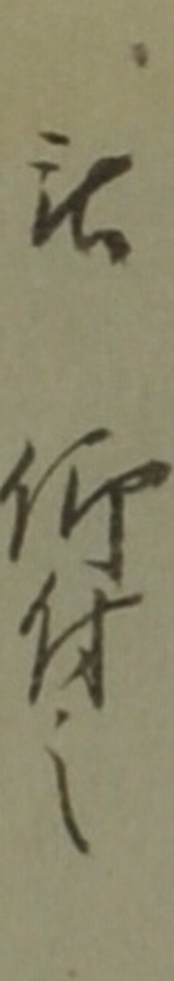被仰付之
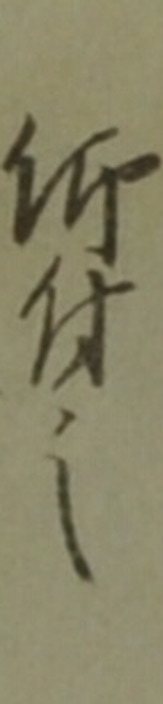仰付之
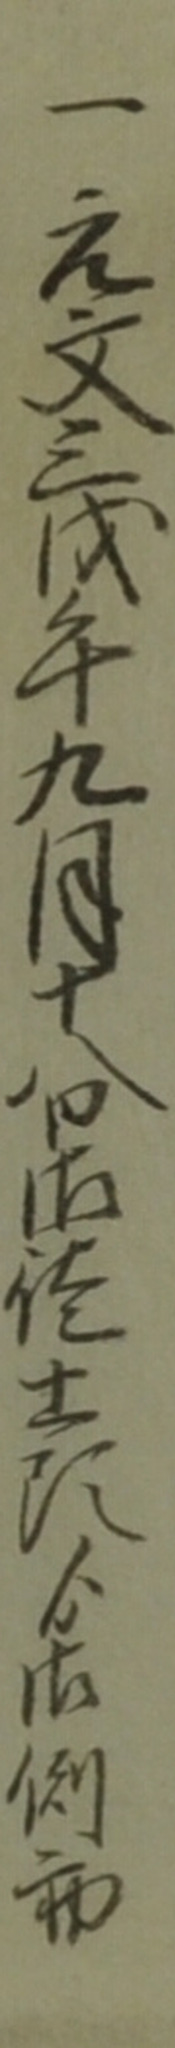一元文三戊午九月十八日御徒士頭ゟ御側勤
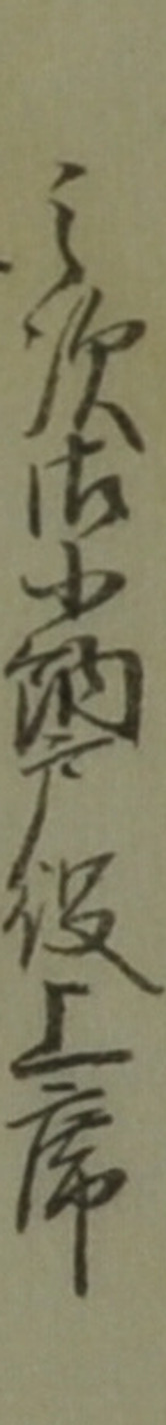之次御小納戸役上席
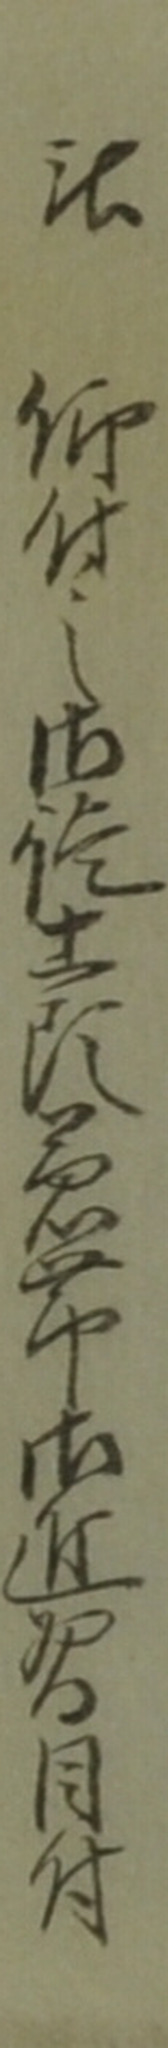被仰付之御徒士頭兼帯御近習目付
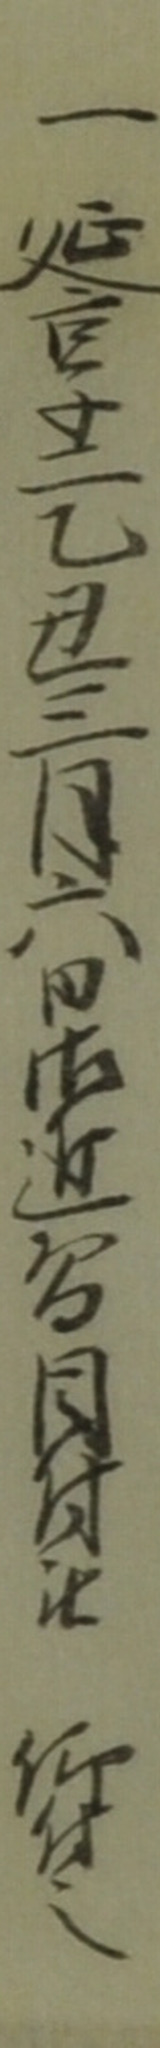一延享二乙丑三月六日御近習目付被仰付之
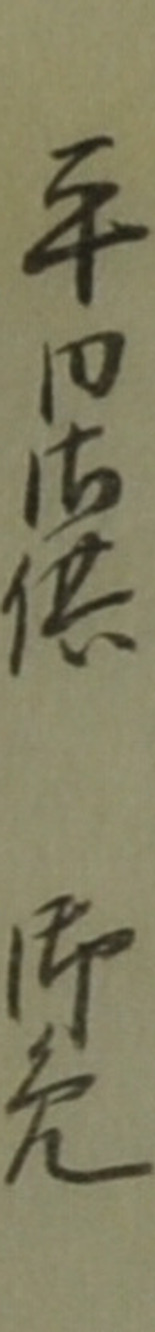平日御供御免
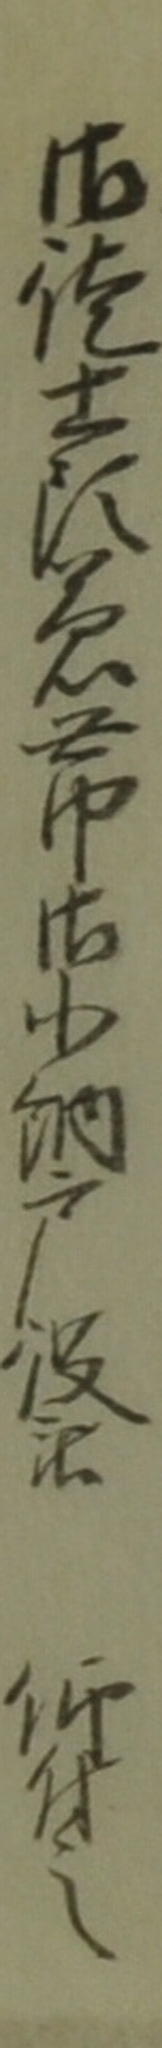御徒士頭兼帯御小納戸役被仰付之
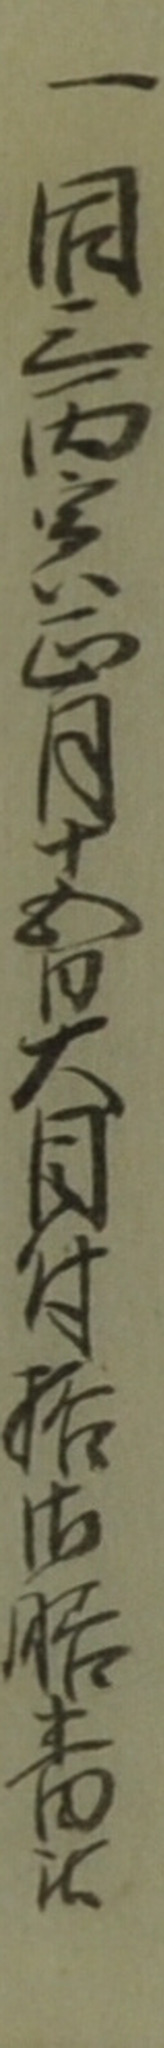一同三丙寅正月十五日大目付格御膳番被
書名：諸御役代々録（五）
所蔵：伊那市立高遠町図書館・合同会社AMANE
